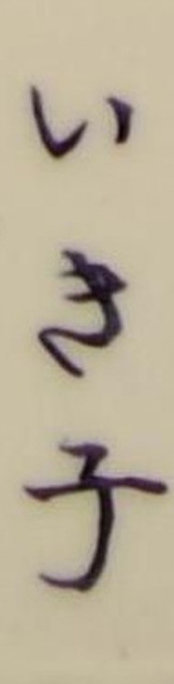いき子
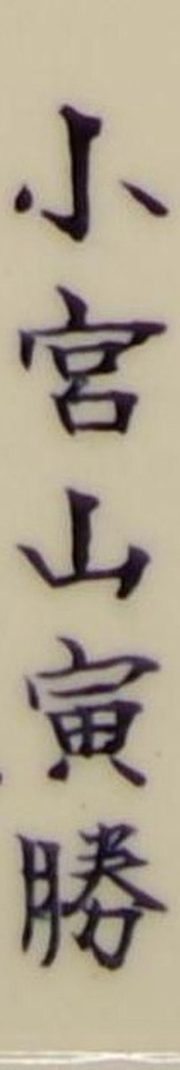小宮山寅勝
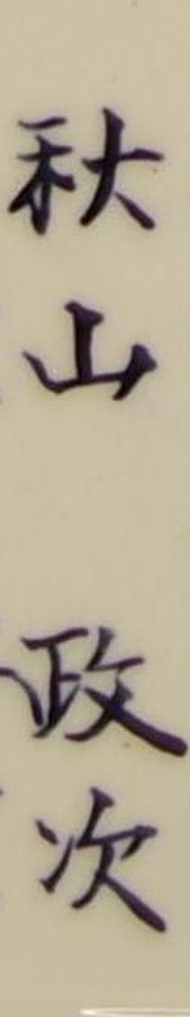秋山政次
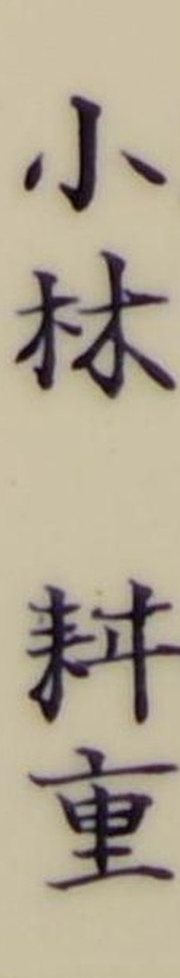小林耕重
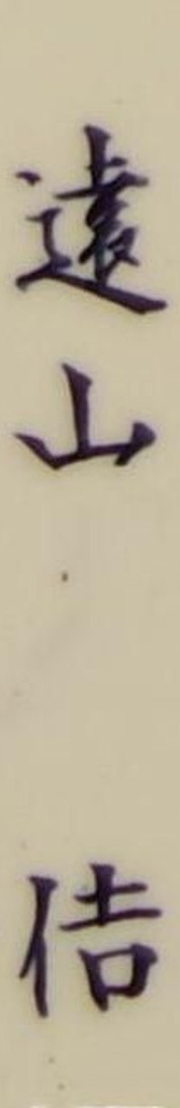遠山佶
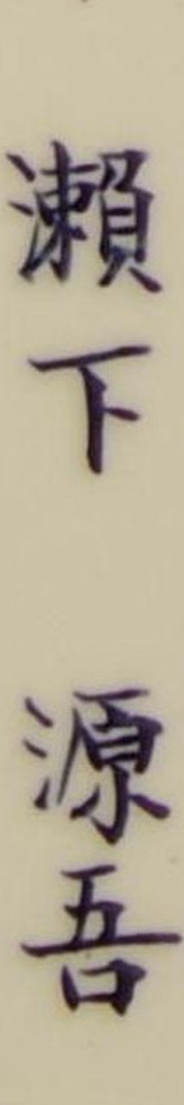瀬下源吾
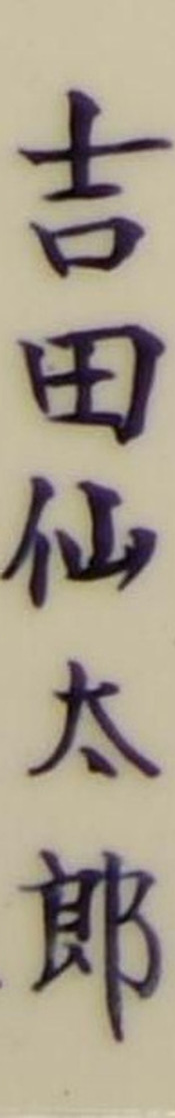吉田仙太郎
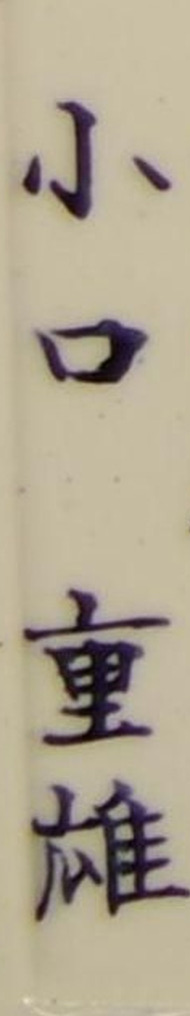小口重雄

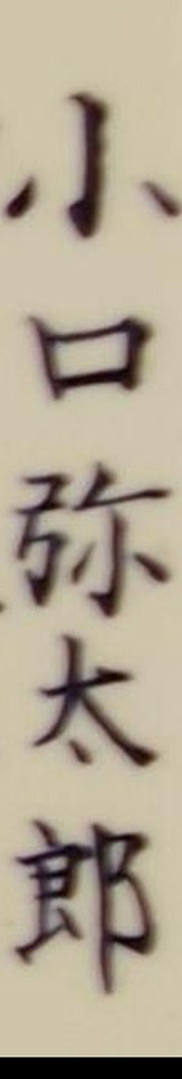小口弥太郎
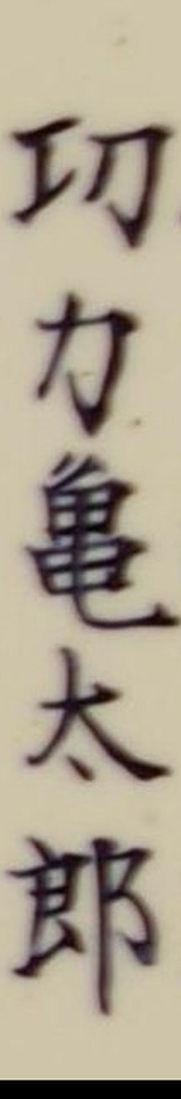功力亀太郎
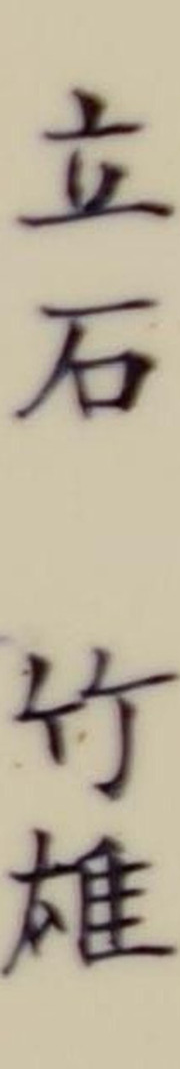立石竹雄
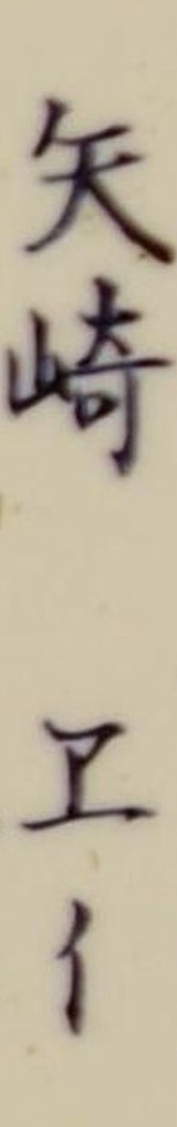矢崎ヱイ
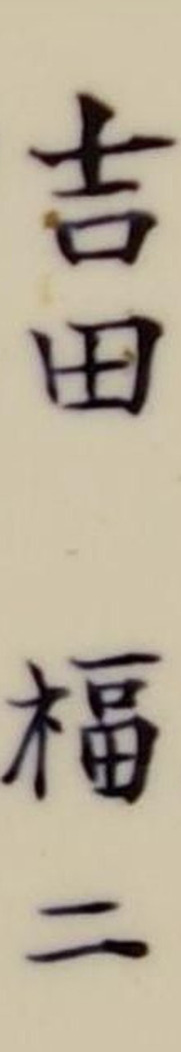吉田福二
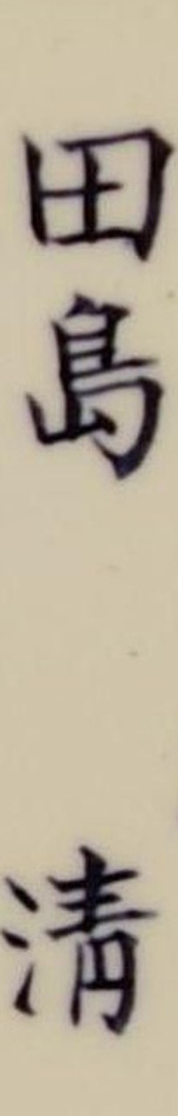田島清
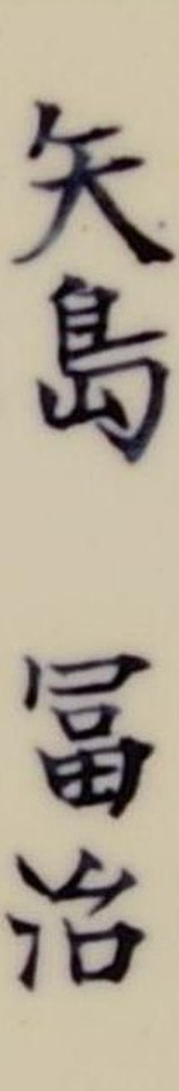矢島冨治
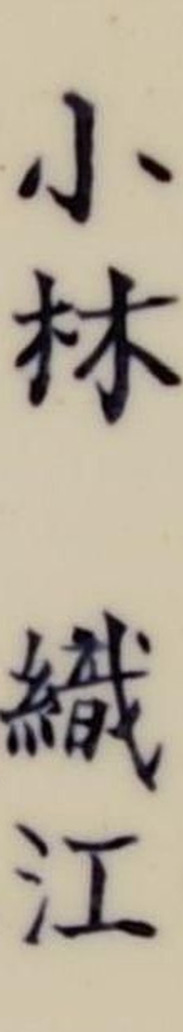小林織江
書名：E~L
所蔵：高野山金剛峯寺
